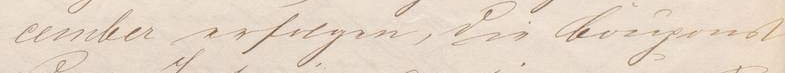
cember erfolgen, die Coupons
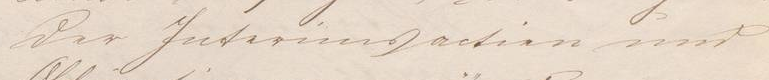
der Interimsactien und
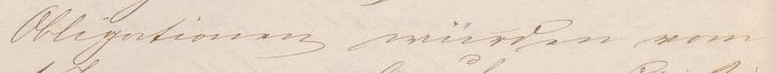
Obligationen würden vom
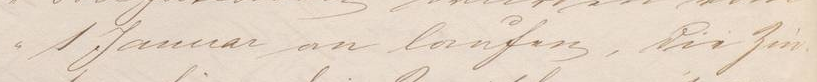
1 Januar an laufen, die Zin-
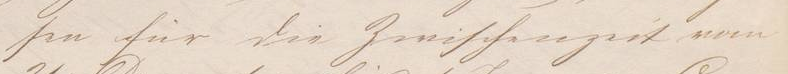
sen für die Zwischenzeit vom
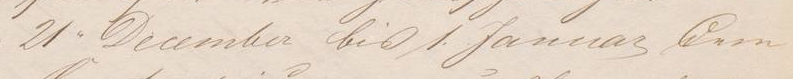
21t December bis 1. Januar dem
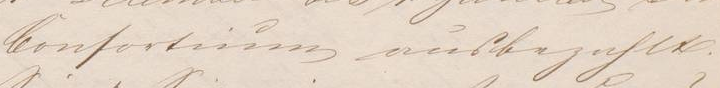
Consortium ausbezahlt.
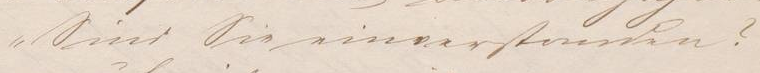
Sind Sie einverstanden?»
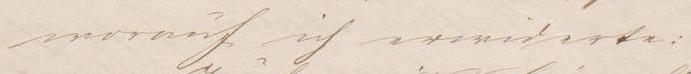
worauf ich erwiderte:
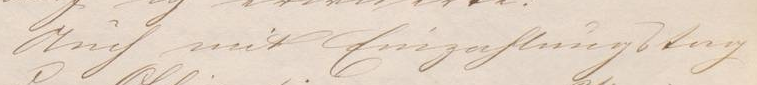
«Auch mit Einzahlungstag
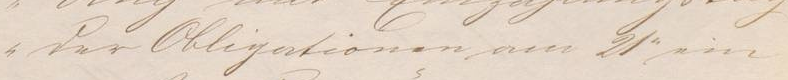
der Obligationen am 21t ein-
